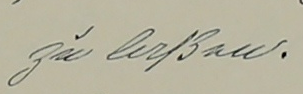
zu laßen.
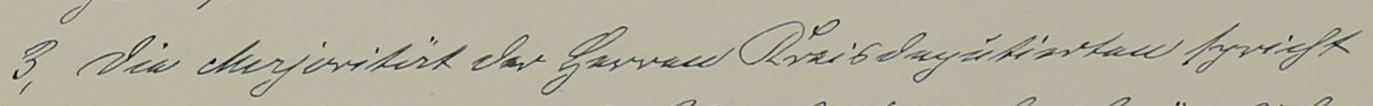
3. Die Majorität der Herren Kreisdeputierten spricht
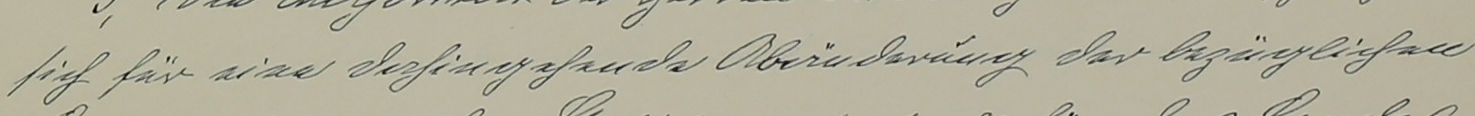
sich für eine dahingehende Abänderung der bezüglichen
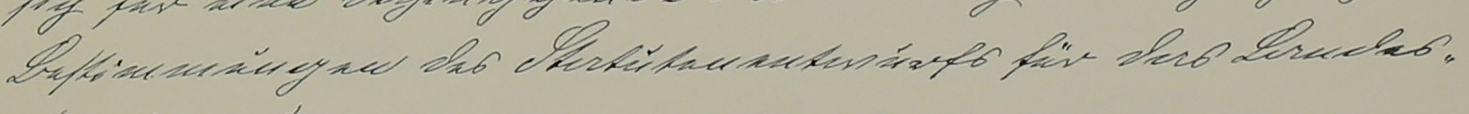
Bestimmungen des Statutenentwurfs für das Landes-
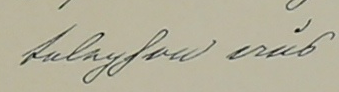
telephon aus
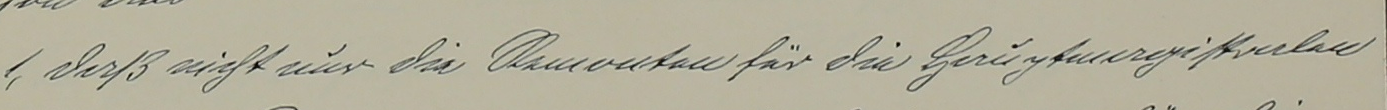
1. daß nicht nur die Remonten für die Hauptmagistralen
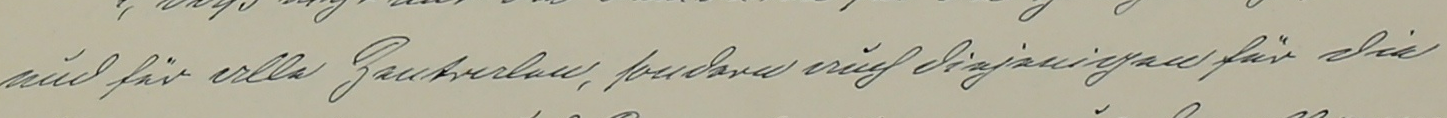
und für alle Zentralen, sondern auch diejenigen für die
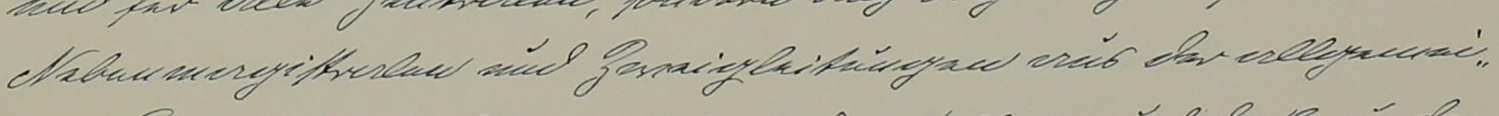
Nebenmagistralen und Zweigleitungen aus der allgemei-
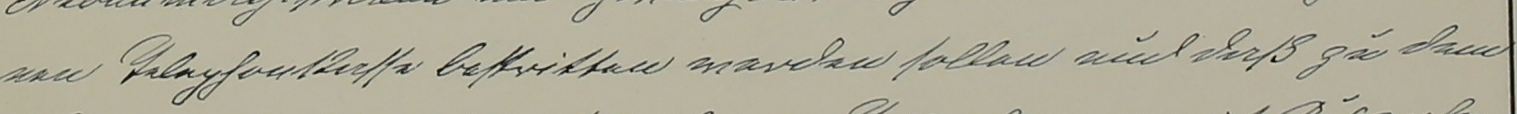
nen Telephonkasse bestritten werden sollen und daß zu dem
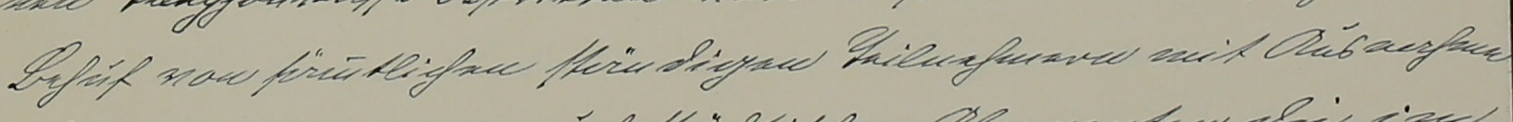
Behuf von sämmtlichen ständigen Teilnehmern mit Ausnahme
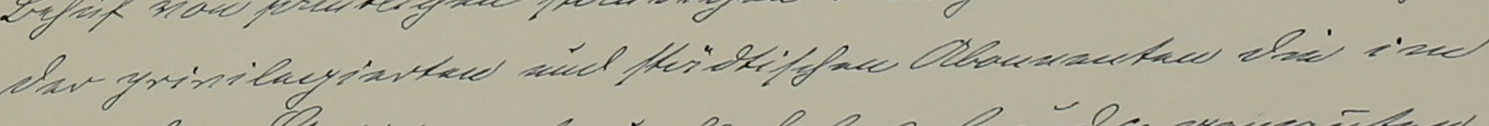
der privilegierten und städtischen Abonnenten die im
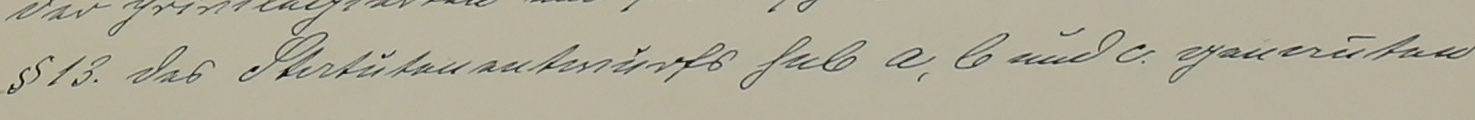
§ 13. des Statutenentwurfs sub a, b und c. genannten
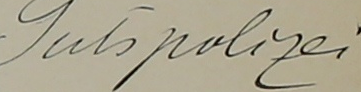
Gutspolizei
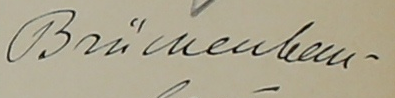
Brückenbau-
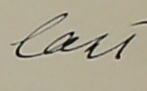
last
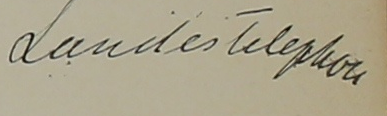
Landes Telephon
